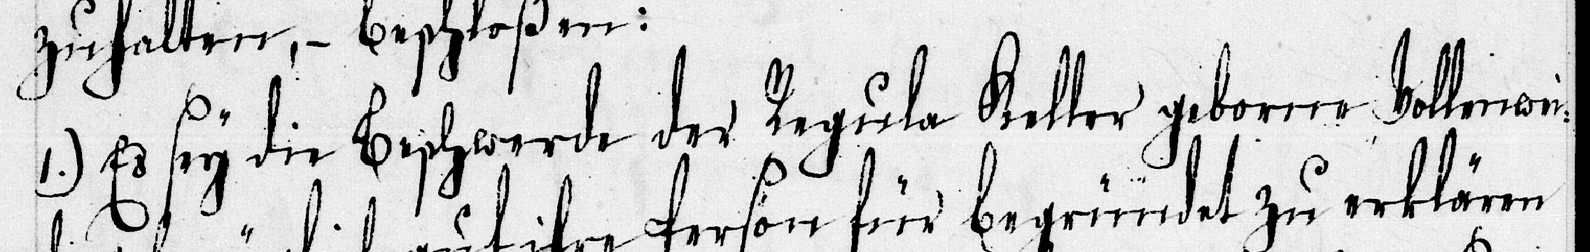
1.) Es sey die Beschwerde der Regula Keller geborne Vollenwei¬
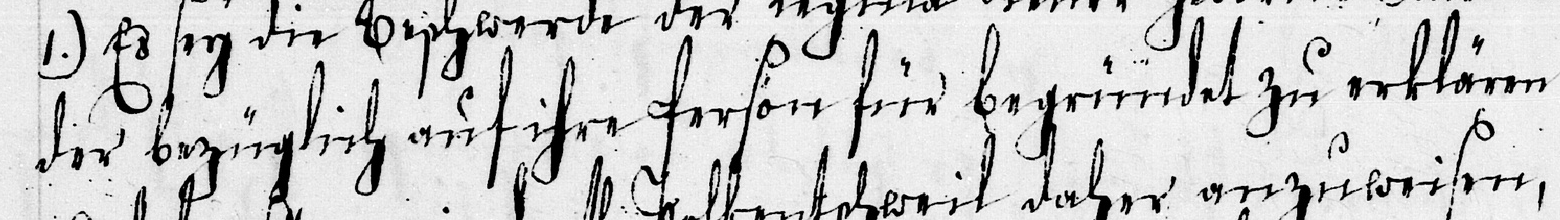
der bezüglich auf ihre Person für begründet zu erklären
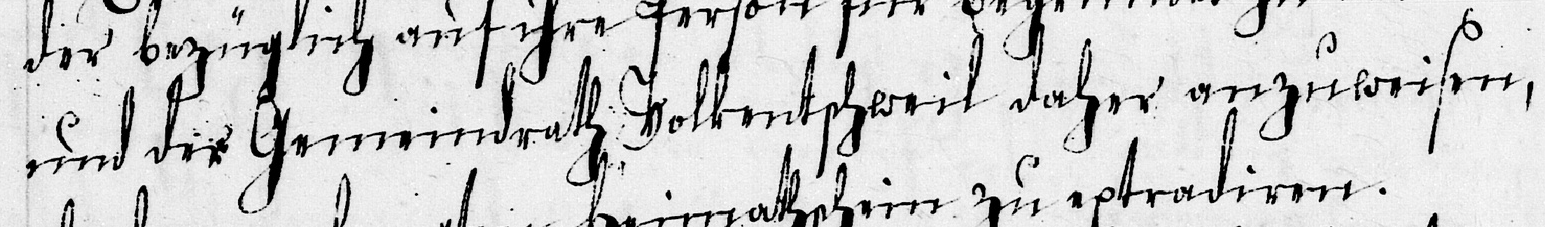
und der Gemeindrath Volkentschweil daher anzuweisen,
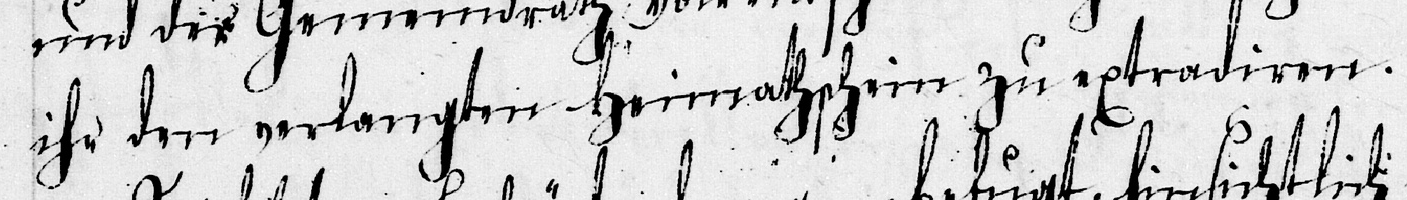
ihr den verlangten Heimathschein zu extradiren.
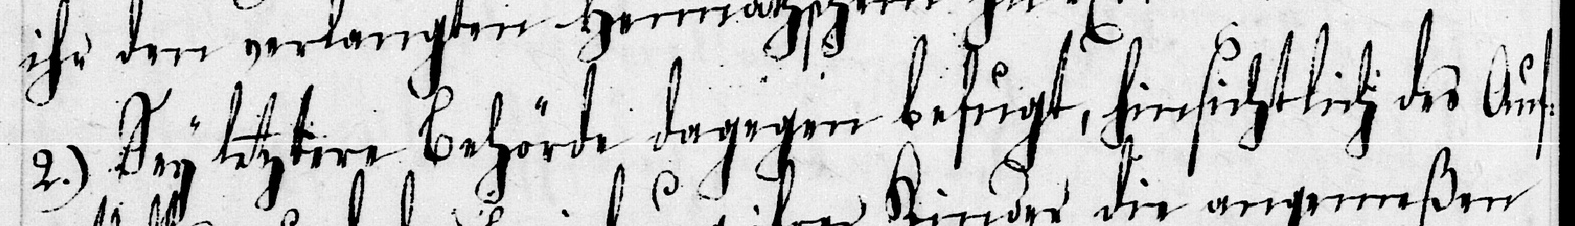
2.) Sey letztere Behörde dagegen befugt, hinsichtlich des A¬
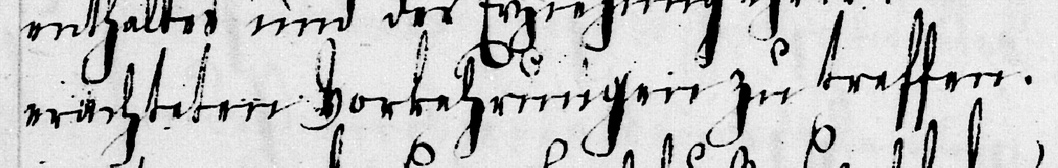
erachteten Vorkehrungen zu treffen.
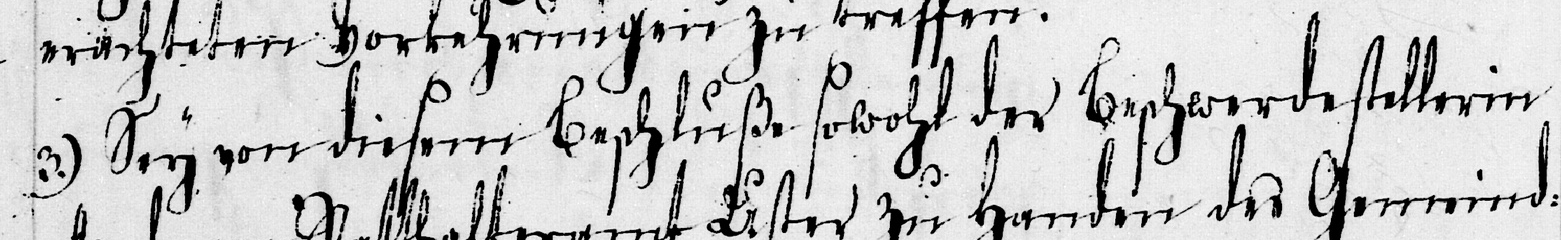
3.) Sey von diesem Beschluße sowohl der Beschwerdestellerin
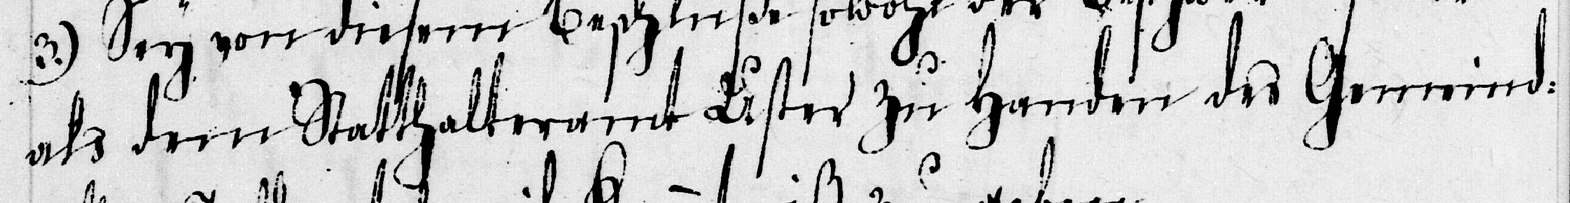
als dem Statthalteramt Uster zu Handen des Gemeind¬
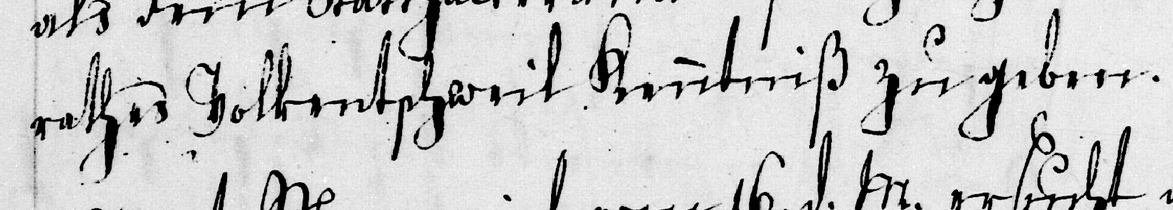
rathes Volkentschweil Kenntniß zu geben.
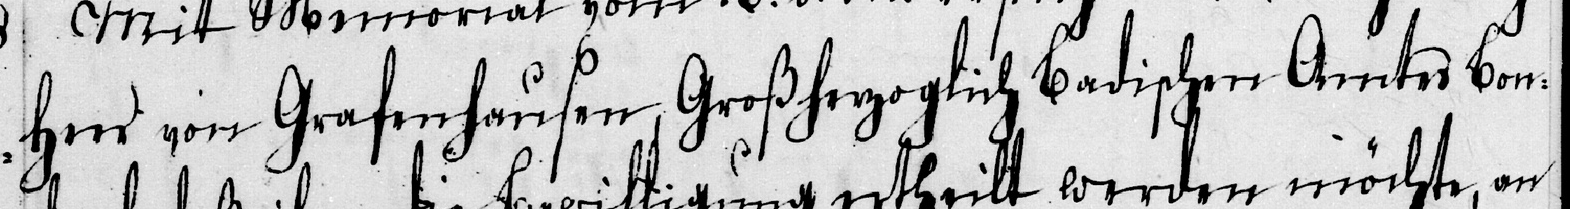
Heer von Grafenhausen, Großherzoglich Badischen Amtes Bon¬
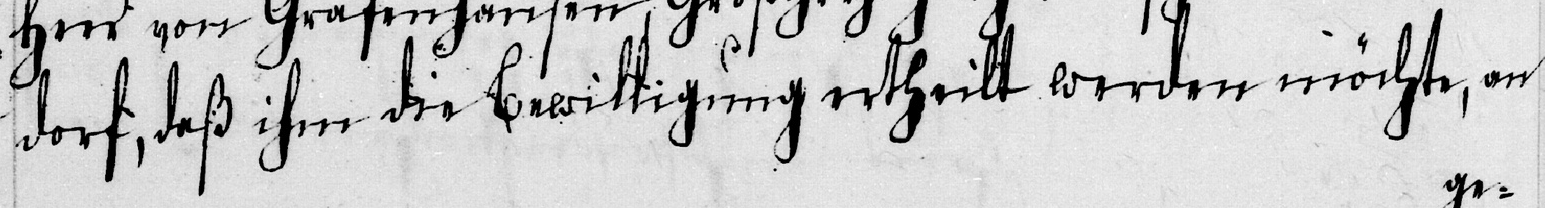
dorf, daß ihm die Bewilligung ertheilt werden möchte, an
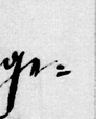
ren
